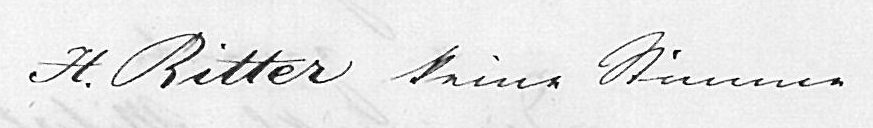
H. Ritter keine Stimme
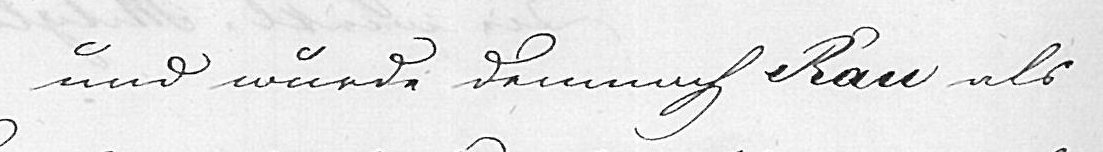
und wurde demnach Rau als
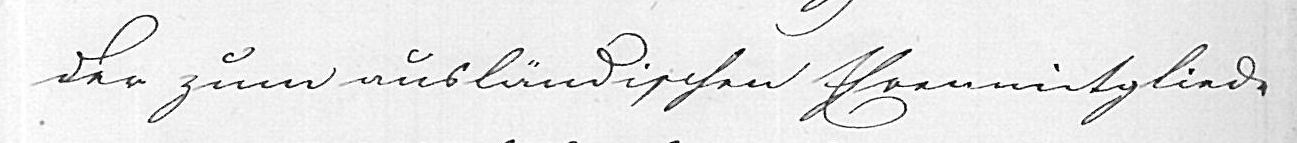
der zum ausländischen Ehrenmitglieder
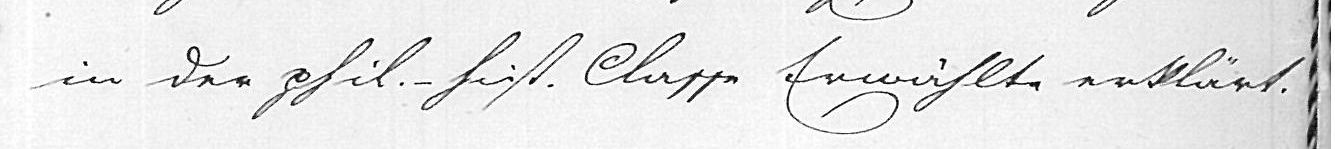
in der phil.-hist. Classe Erwählte erklärt.
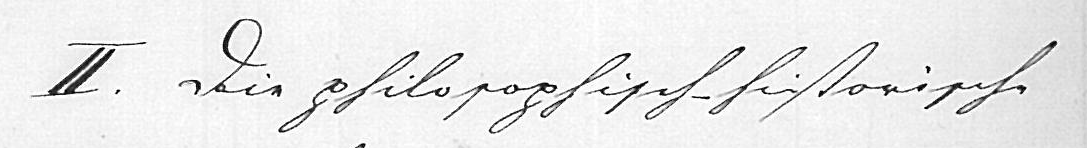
II. Die philosophisch-historische
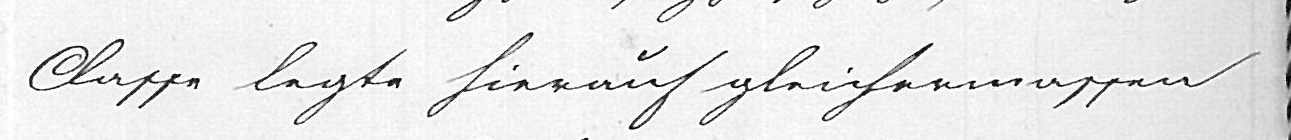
Classe legte hierauf gleichermassen
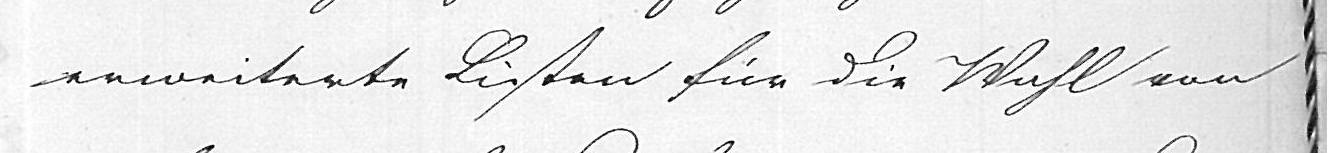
erweiterte Listen für die Wahl von
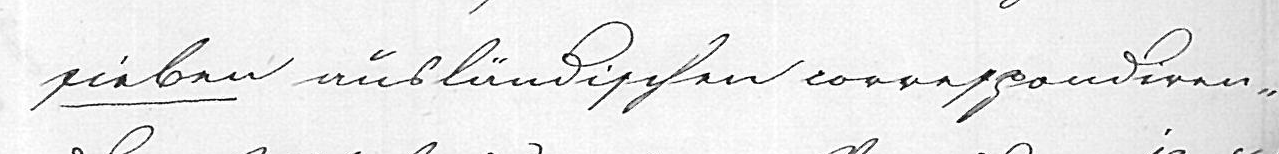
sieben ausländischen correspondiren-
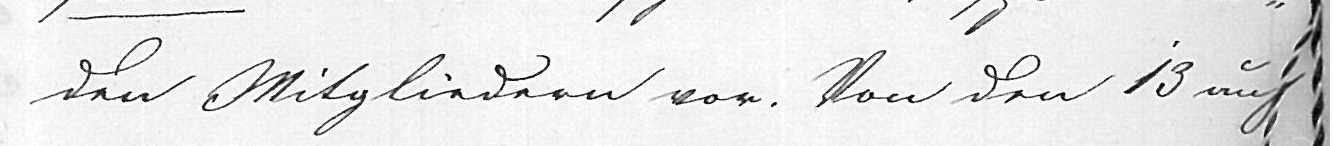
den Mitgliedern vor. Von den 13 auf
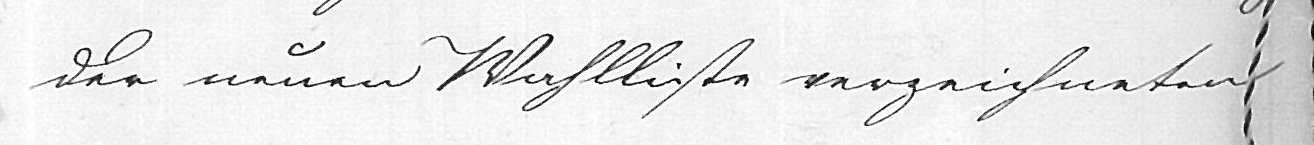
der neuen Wahlliste verzeichneten
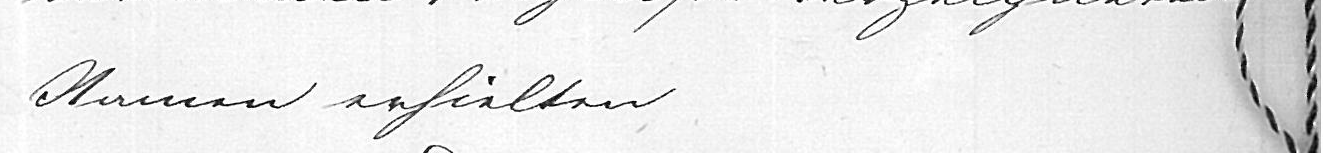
Namen erhielten
